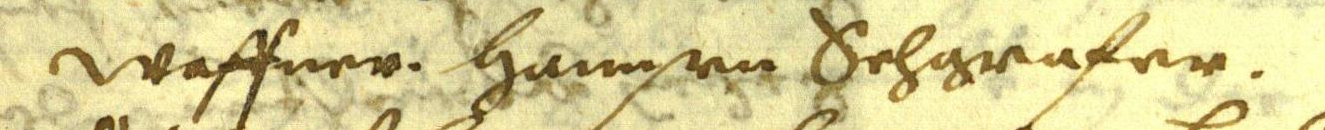Waffner. Hannsen Schgrafer.
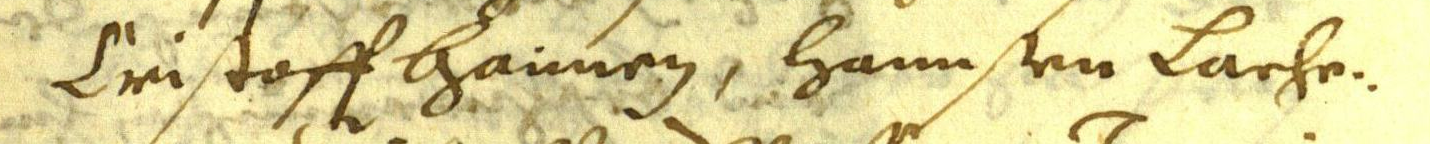Cristoff Haimen, Hannsen Lache¬
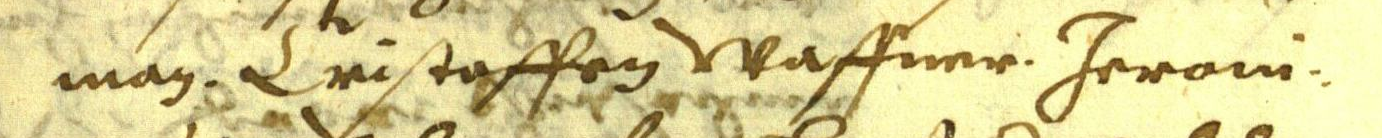man. Cristoffen Waffner. Jeroni¬
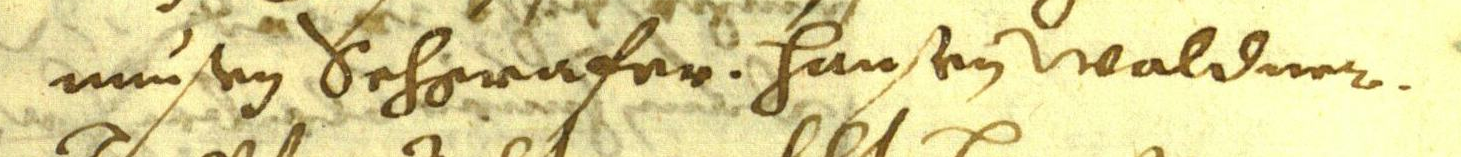mūsen Schgrafer. hansen Waldner.
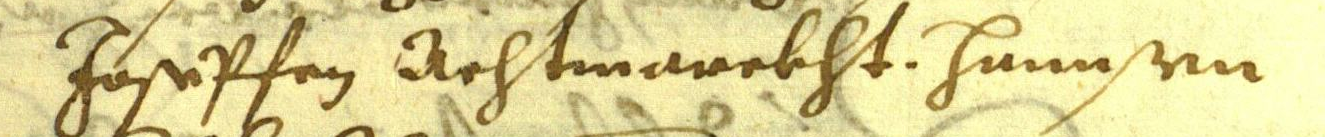JosePfen Achtmarckht. hannsen
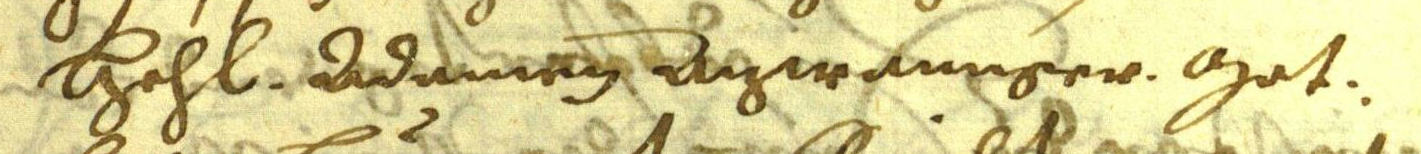Hehl. Adamen Atzwannger. Mat¬
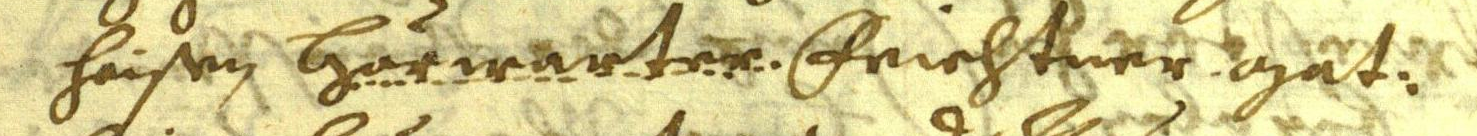heisen Hōrwarter. Feichtner. Mat¬
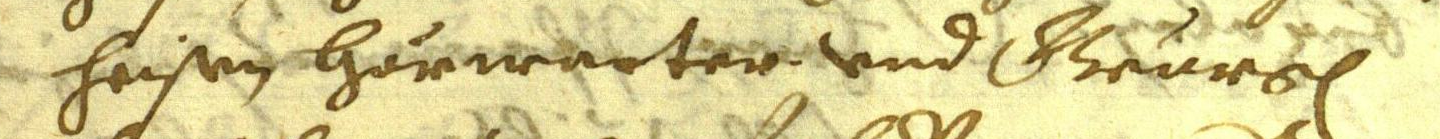heisen Hōrwarter. vnd Geōrg
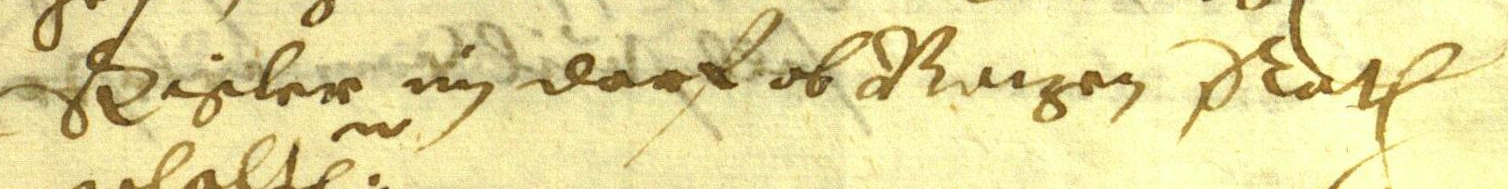Rigler im dorf ob Bozen Rath
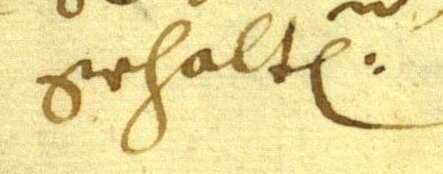gehalt:
